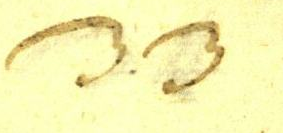33
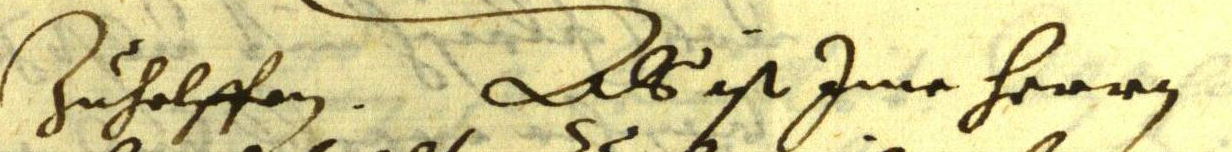Zūhelffen. Als ist Ime herrn
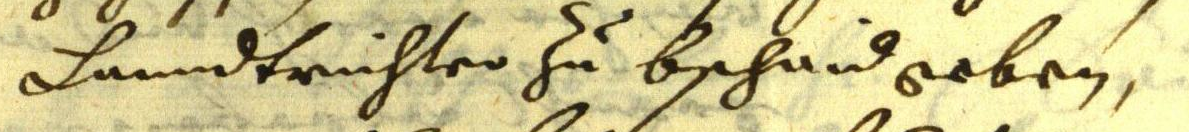Lanndtrichter Zū bschaid geben,
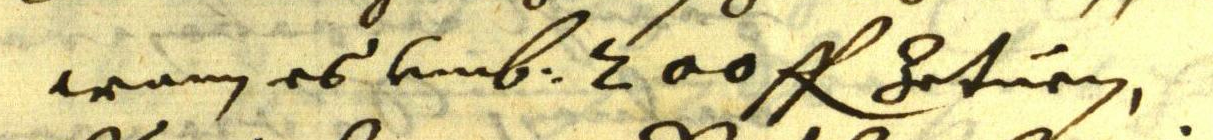wann es umb: 200 fl Zetūen,
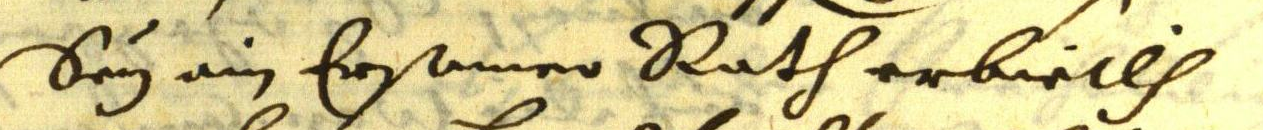Seȳ ain Ersamer Rath erbietlich
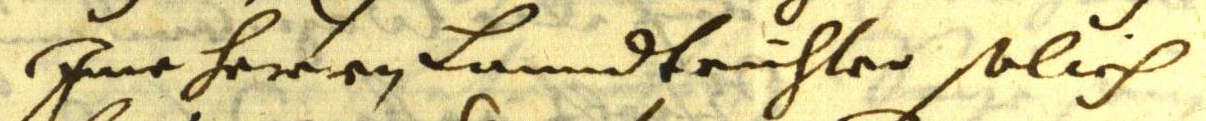Ime herrn Lanndtrichter solich
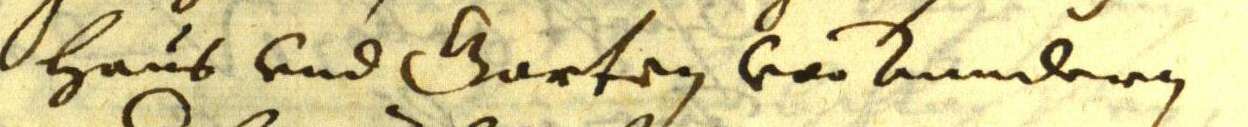Haūs vnd Garten von Anndern
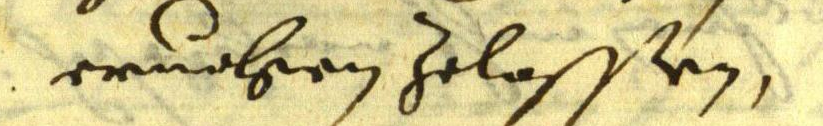erūolgen Zelassen,
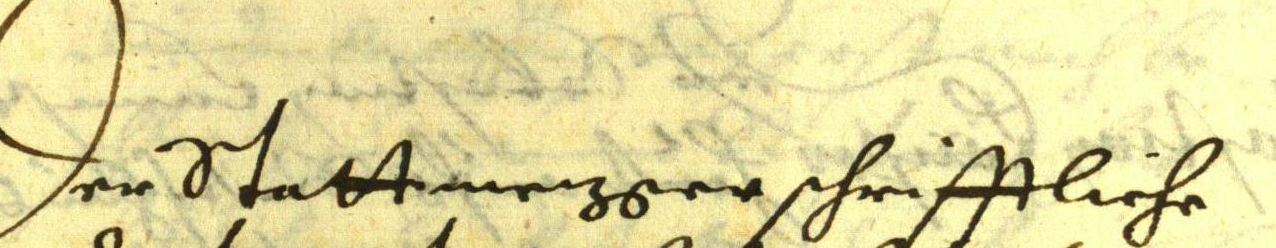Der Stattmezger schrifftliche
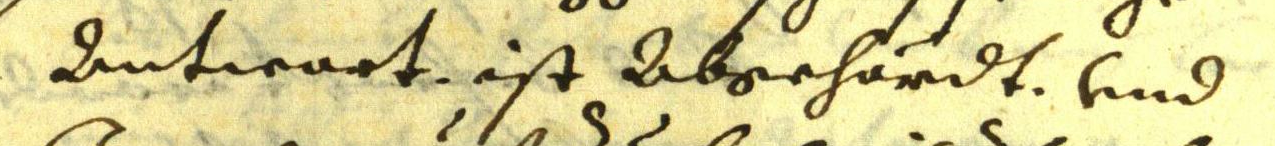Antwort, ist Abgehōrdt. vnd
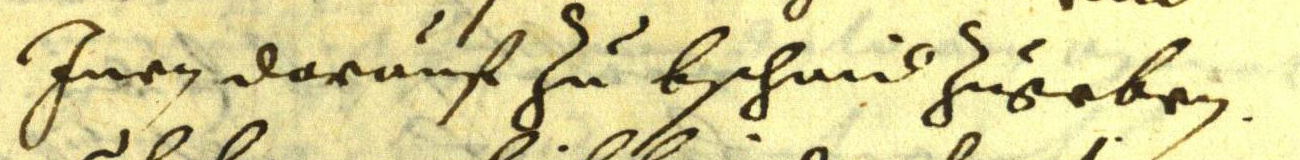Inen daraūf Zū bschaid Zūgeben.
